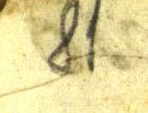81
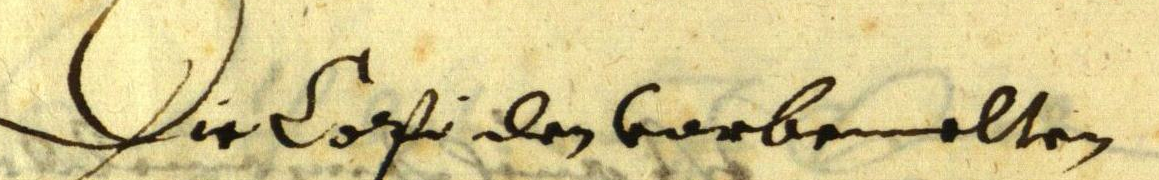Die CoPi den vorbemelten
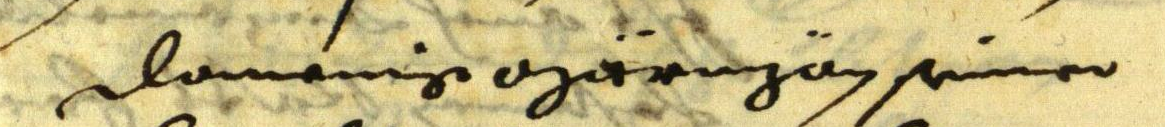Domenig Märnzän seiner
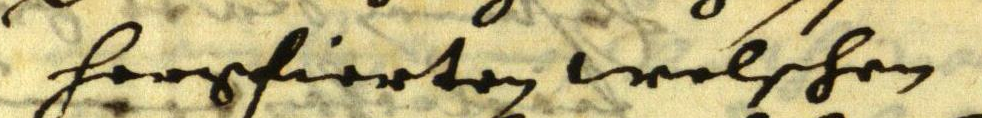hergfierten welschen
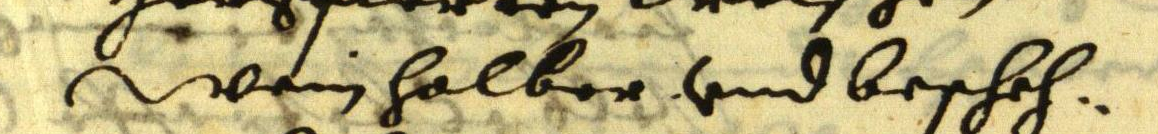Wein halber. vnd bescheh¬
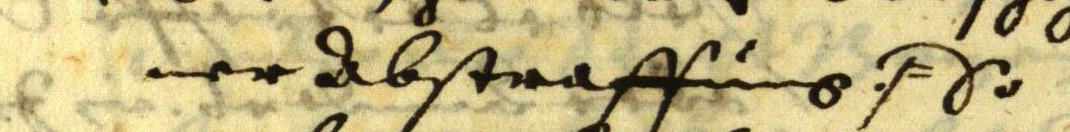ner Abstraffūng. So
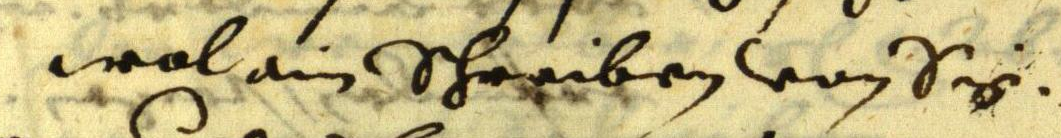wol ain Schreiben von Sig¬
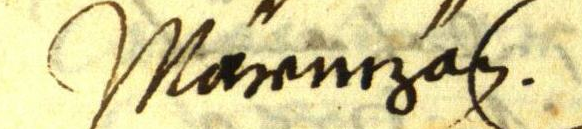Märnzän.
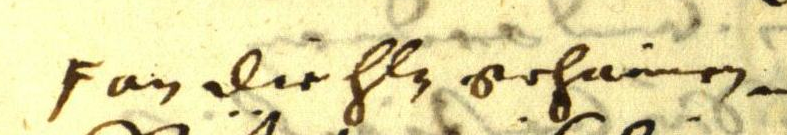an die hln gehaimen
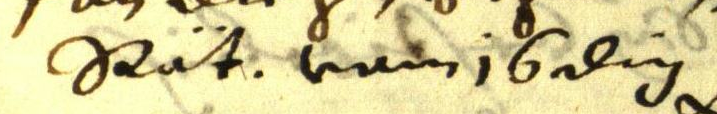Rät. vom 16. diz
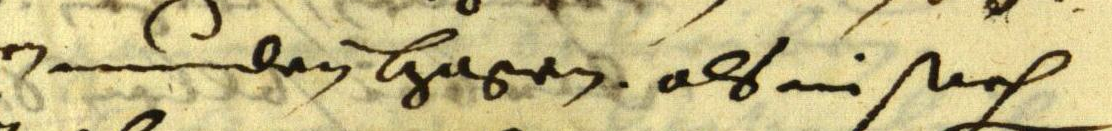mūnden Hagen. als in sach.
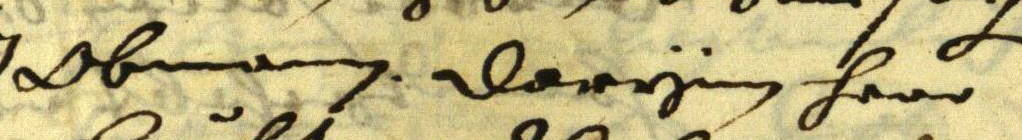Obmann. darÿnn herr
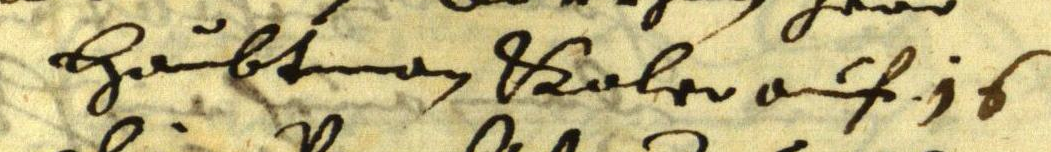Haūbtman Koler aūf. 16
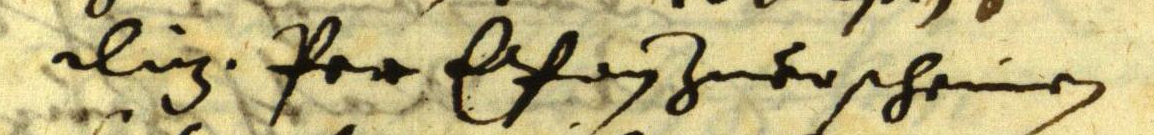diz. Per EPan Zūerscheinen
